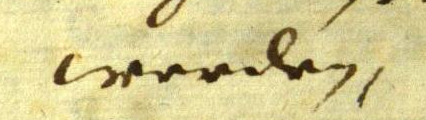werden,
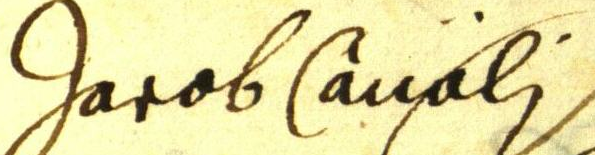Jacob Canälj
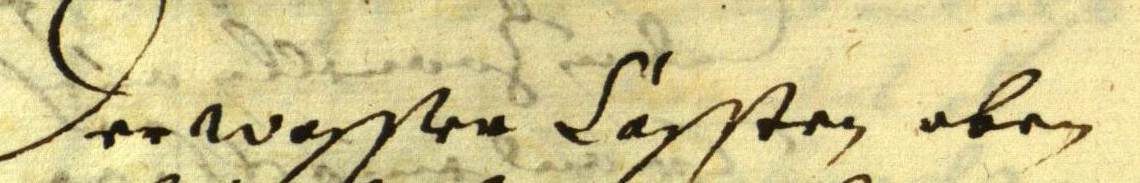Der Wasser Cassten oben
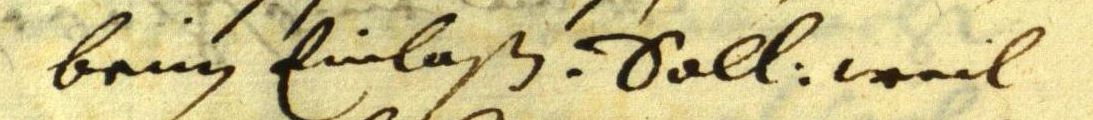beim Einlaß. Soll: weil
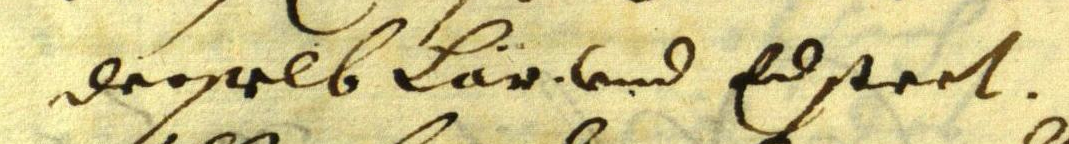derselb Lär. vnd Ed steet.
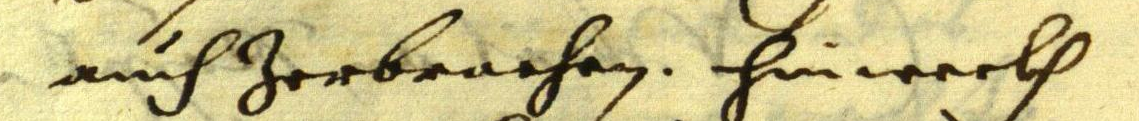aūch Zerbrochen. hinweckh
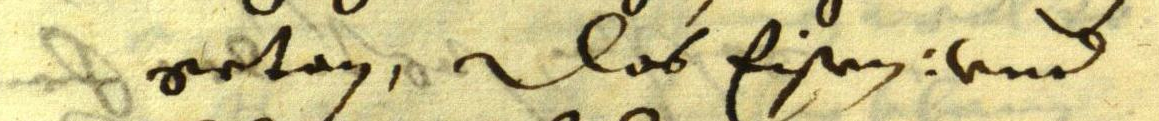getan, Das Eisen: vnd
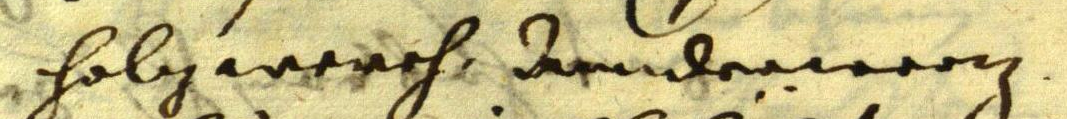holz werch. Annderwerz.
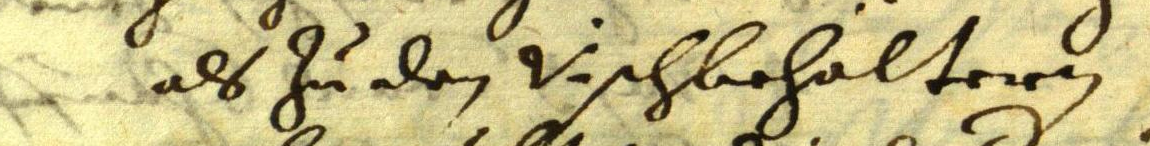als Zū den Vischbehältern
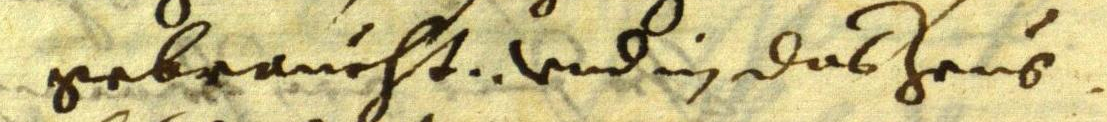gebraūcht: vnd in das Zeūg¬
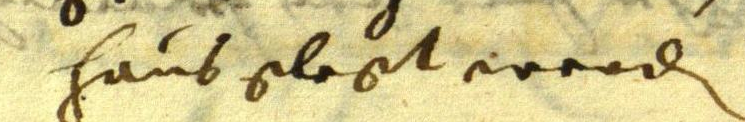haūs glegt werd.
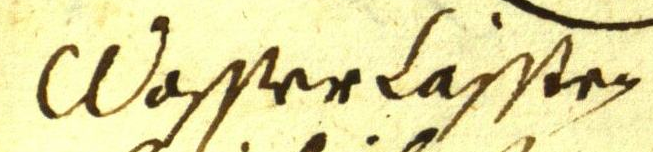Wasser Cassten
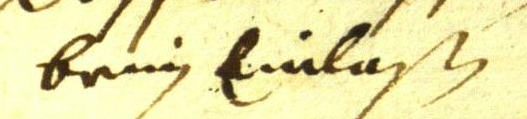beim Einlaß
